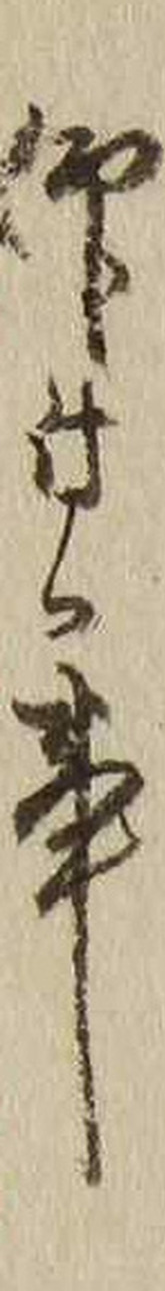仰付候事
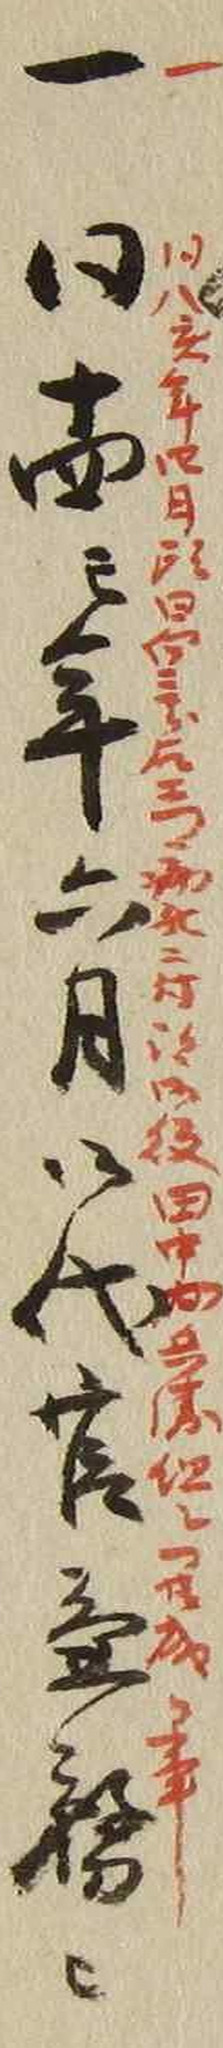一同十四巳年六月御代官兼務被
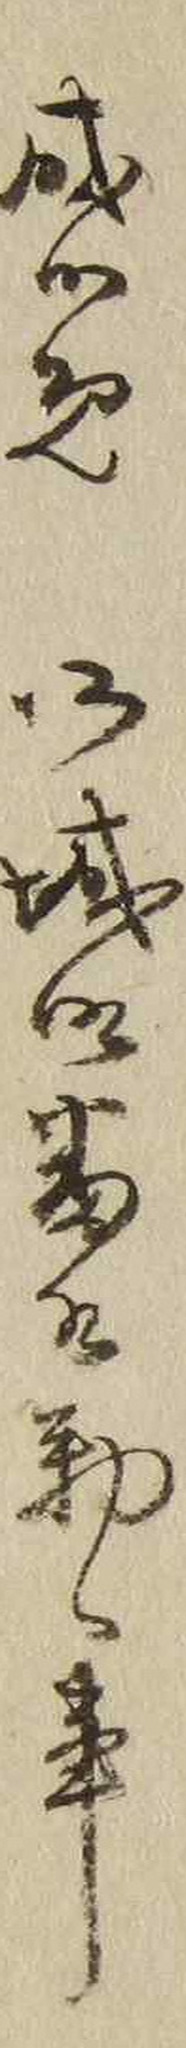成御免御城御番勤候事
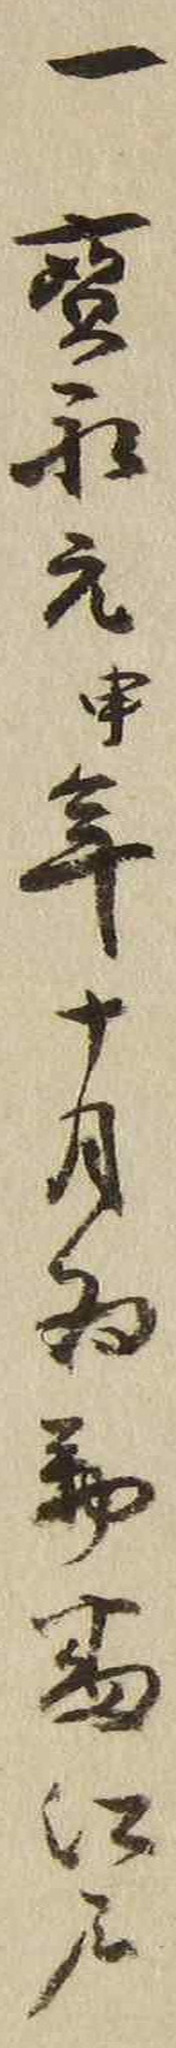一宝永元申年十月為勤番江戸
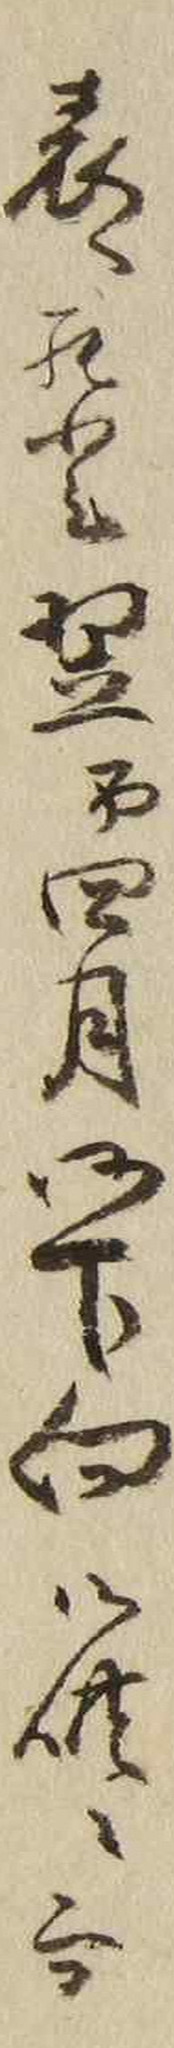表へ罷登翌酉四月御下向御供ニ而

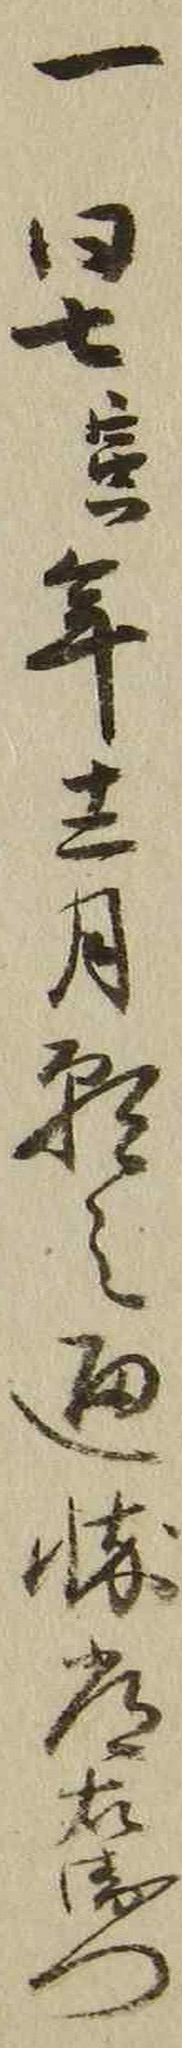一同七寅年十二月願之通忰常右衛門
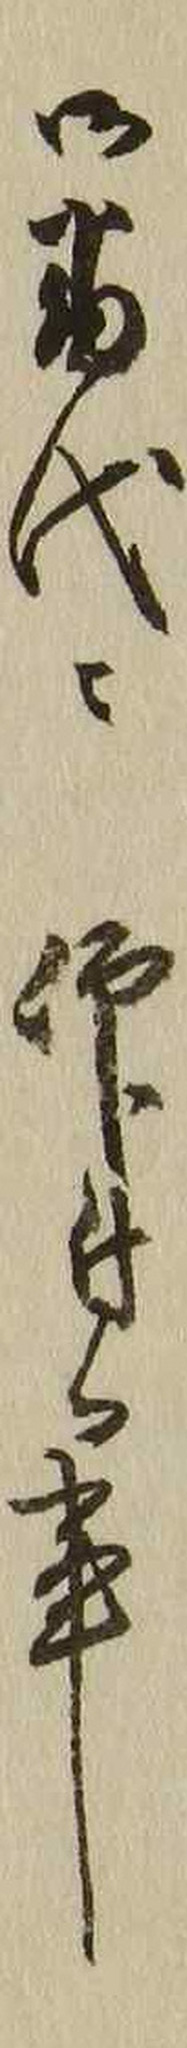御番代被仰付候事
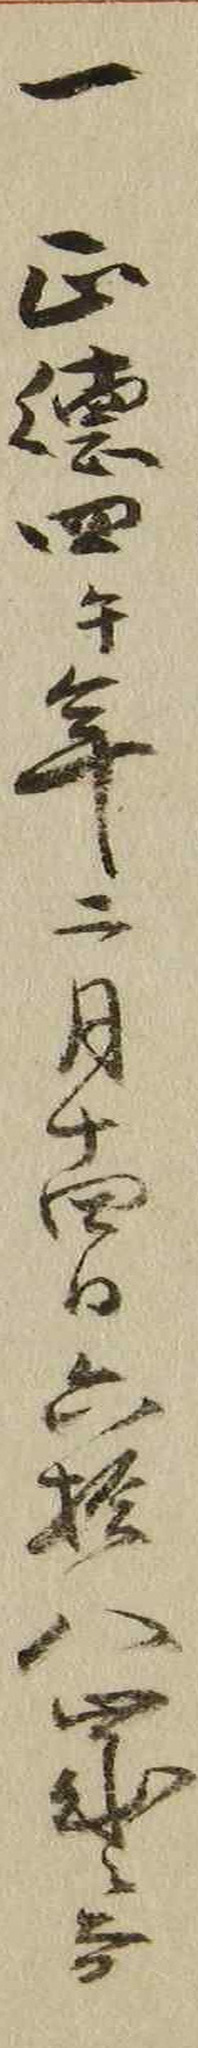一正徳四午年二月十四日六拾八歳ニ而
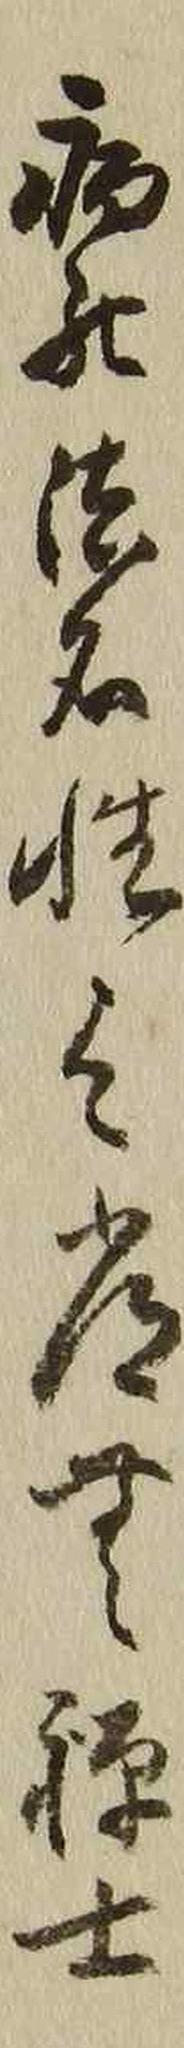病死法名性与常無禅士
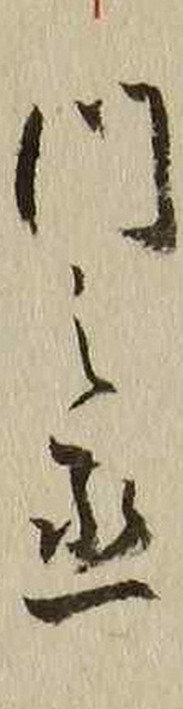門之丞
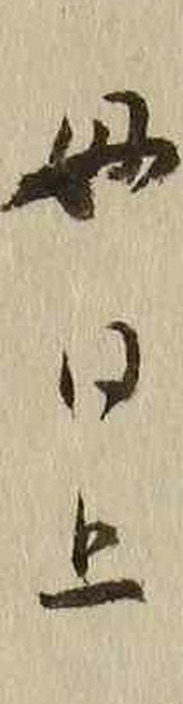母同上
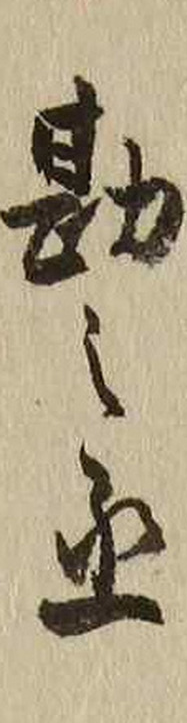勘之丞
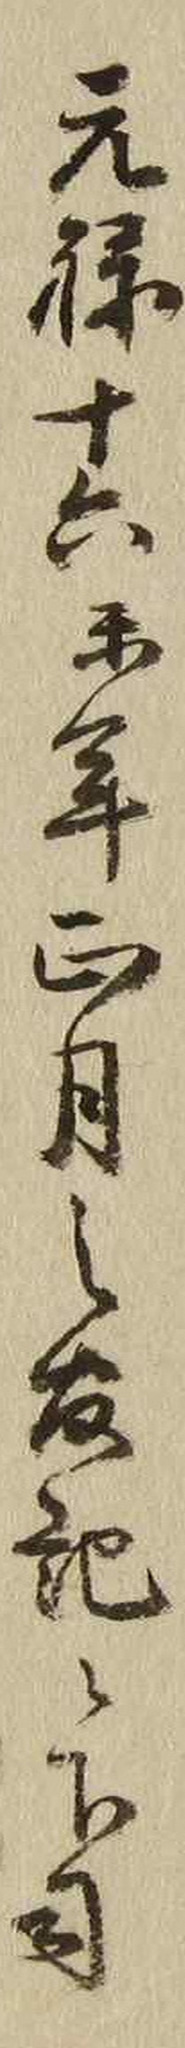元禄十六未年正月之官記ニ下司
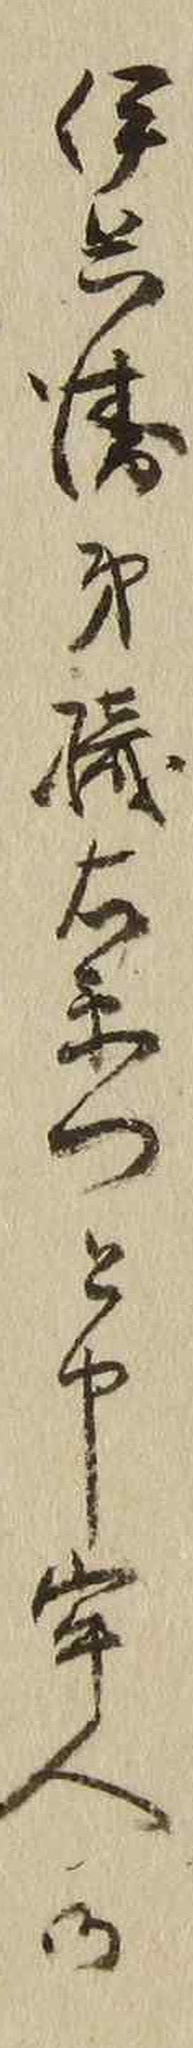伊兵衛弟磯右衛門と申牢人御
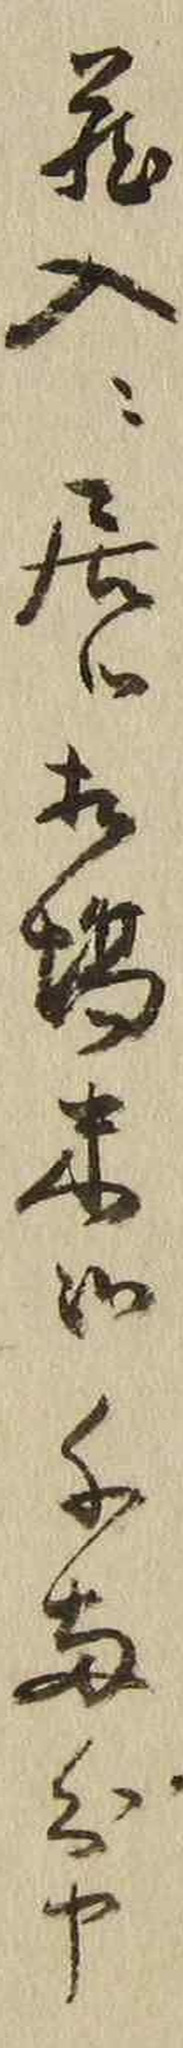蔵入ニ居候相場米弐千両分申
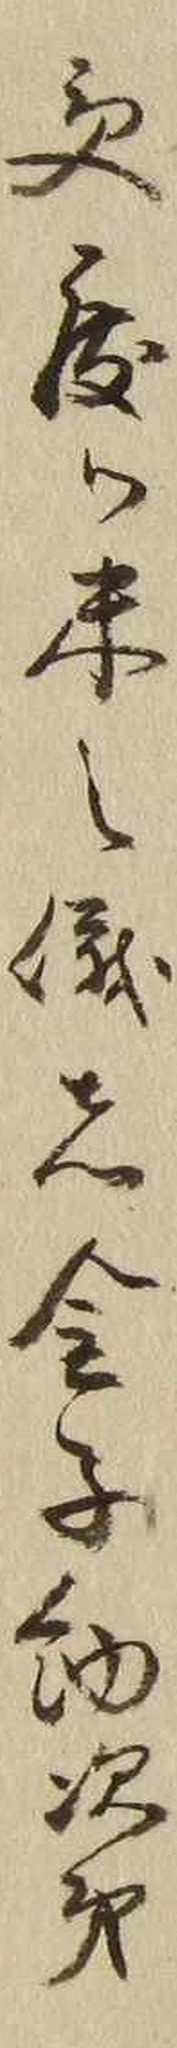受度御米之儀者金子納次第
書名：諸士系譜　巻之232　け之部1
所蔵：会津若松市立会津図書館
